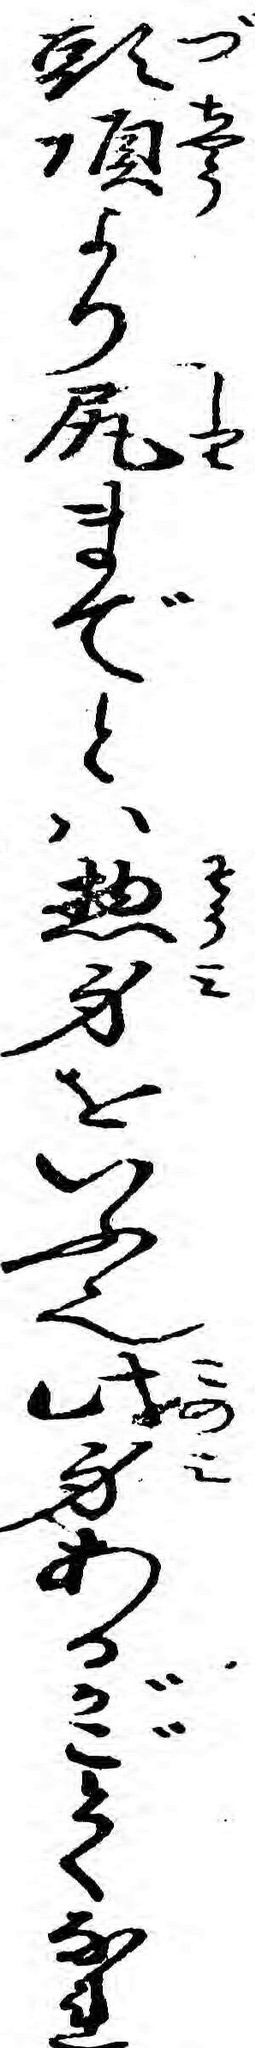頭項より尻までとは惣身をいふ也此身あるがごとくなれ
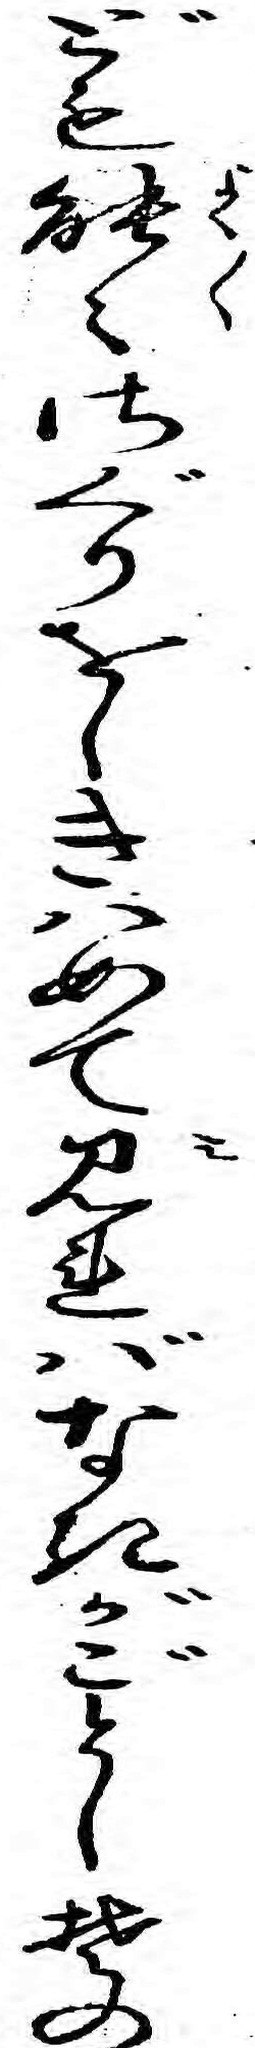ども能々さぐりをしきはめて見ればなきがごとしその
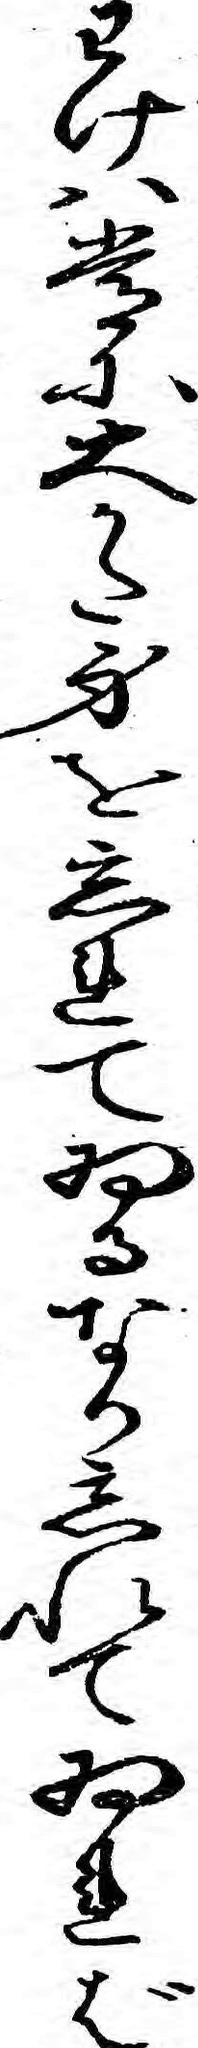わけは常に大かた身を忘れてゐるなり忘れてゐれば
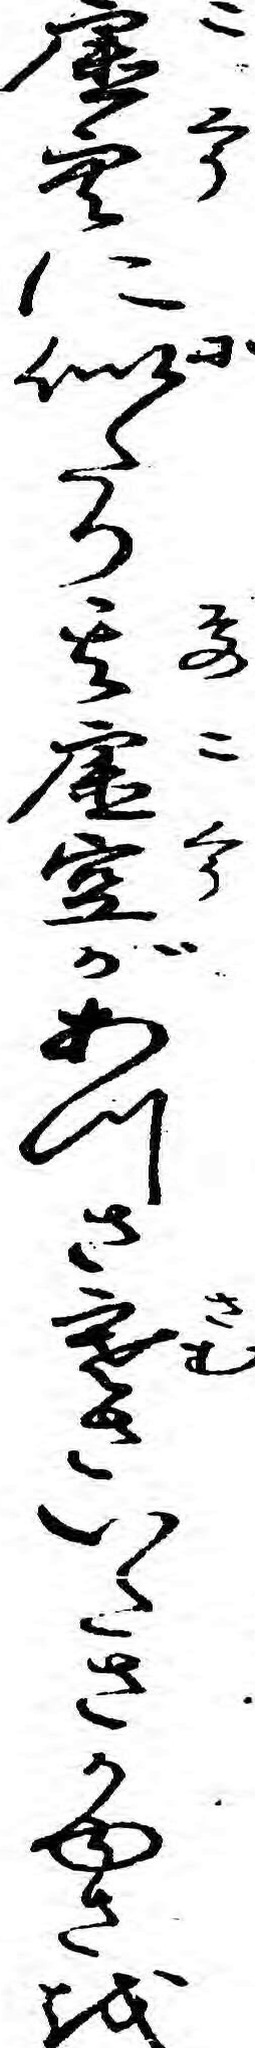虚空に似たり其虚空があつさ寒さいたさかゆさを
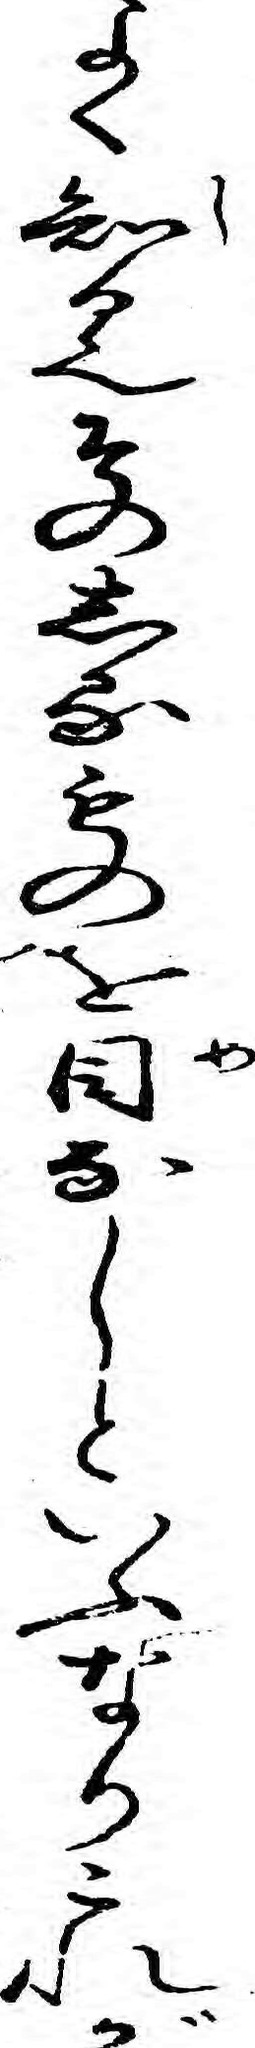よく知る也そのしるものを目なしといふなりこれが
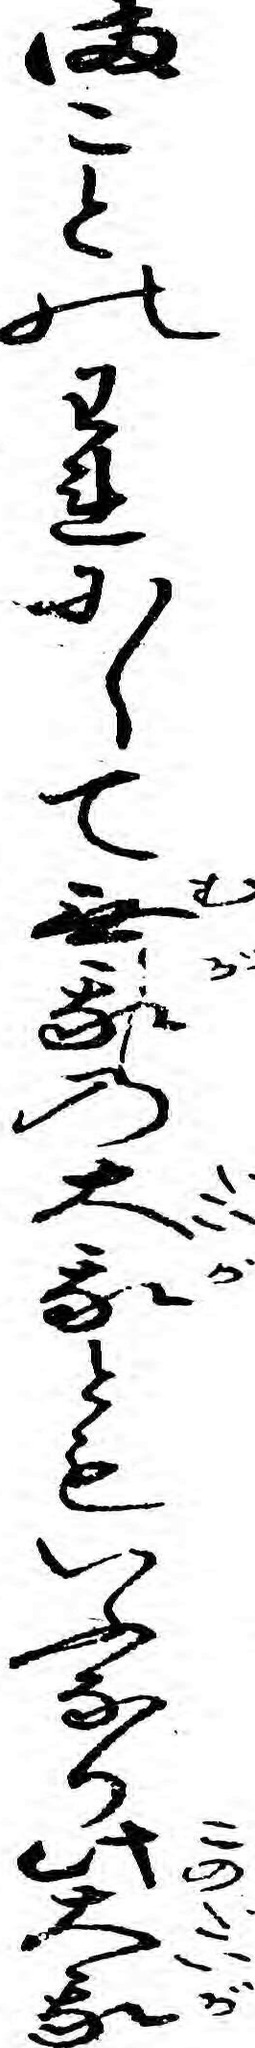まことのわれにして無我の大我ともいふなり此大我
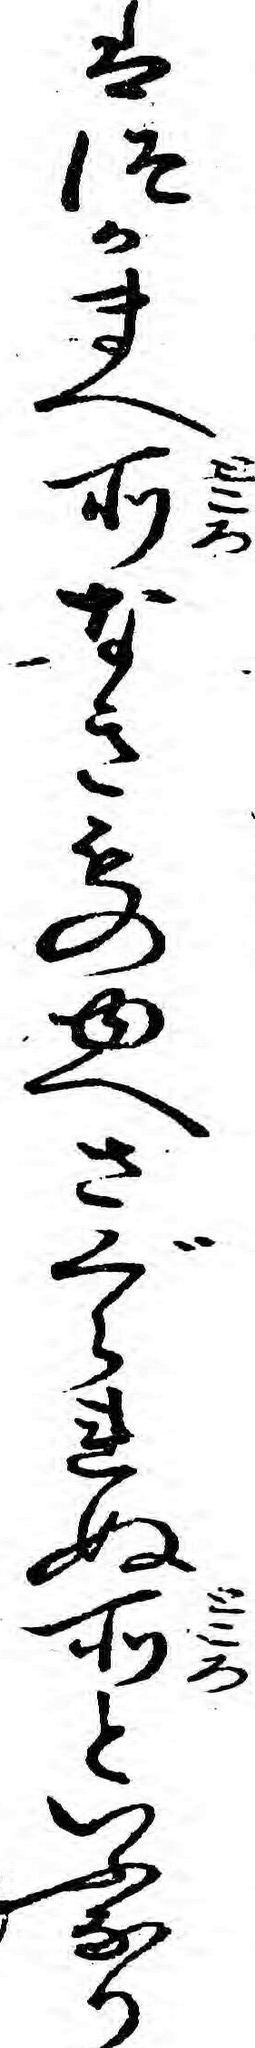はつかまへ所なきものゆへさぐられぬ所といふなり

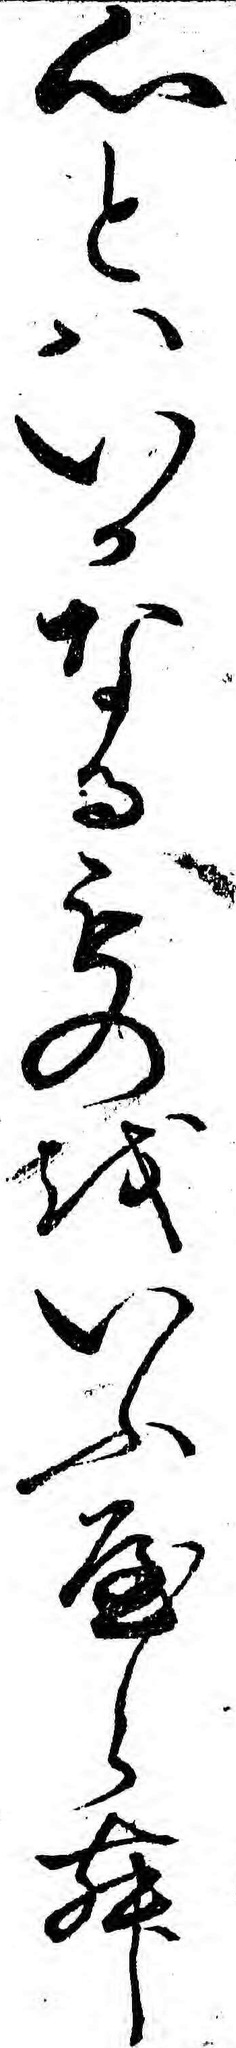心とはいかなるものをいふやら無
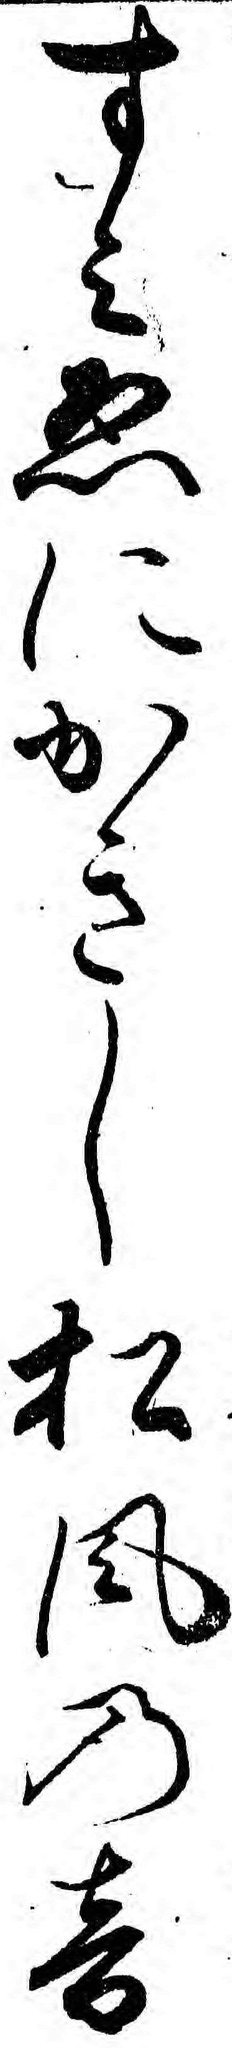すみゑにかきし松風の音
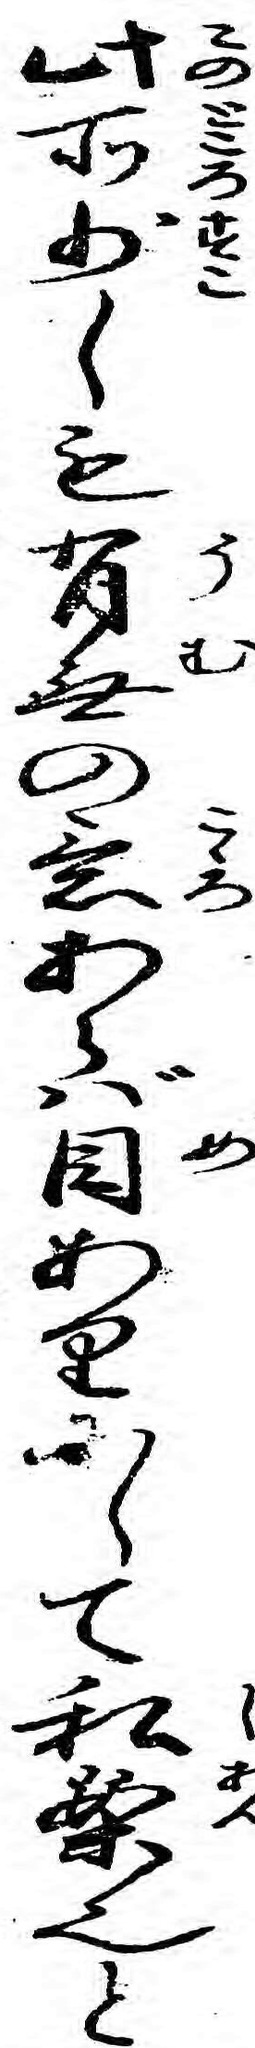此所少しも有無の意あらば目ありにして私案也と
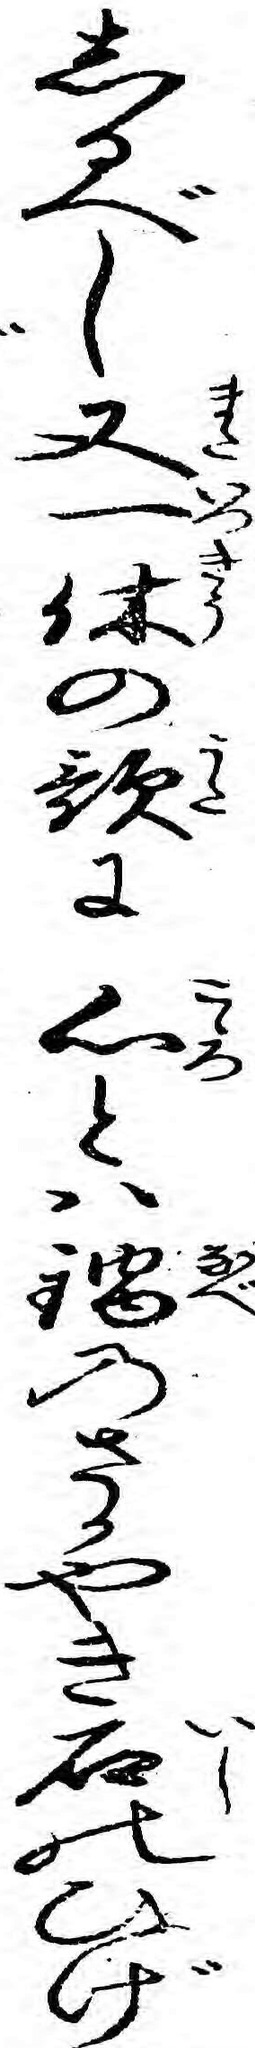しるべし又一休の歌に心とは鍋のさかやき石のひげ
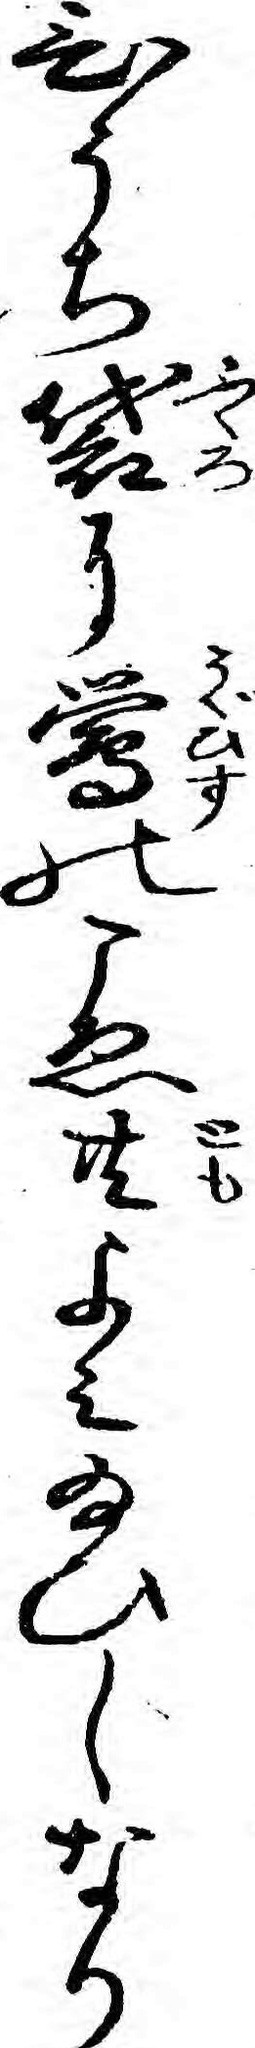ひうち袋に鶯のこゑ共よみ給ひしなり
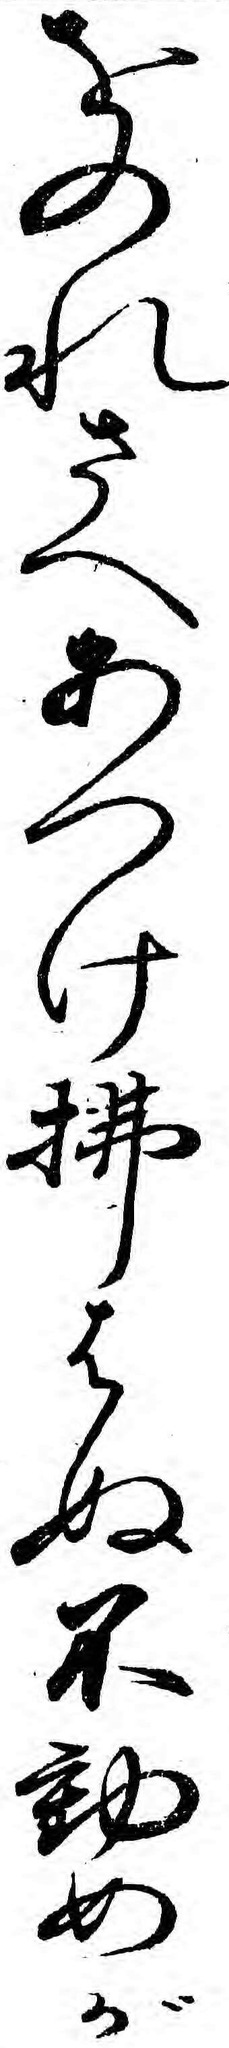をのれさへあつけ払はぬ不動めが
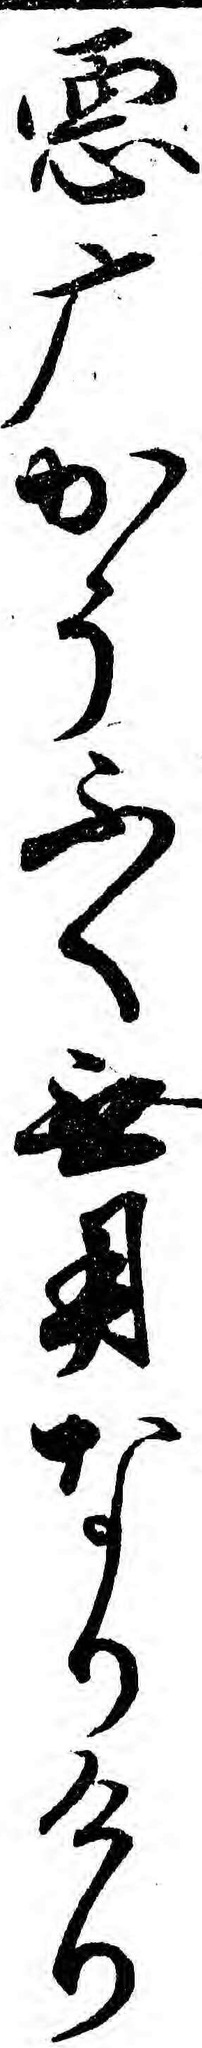悪魔がうぶく無用なりけり
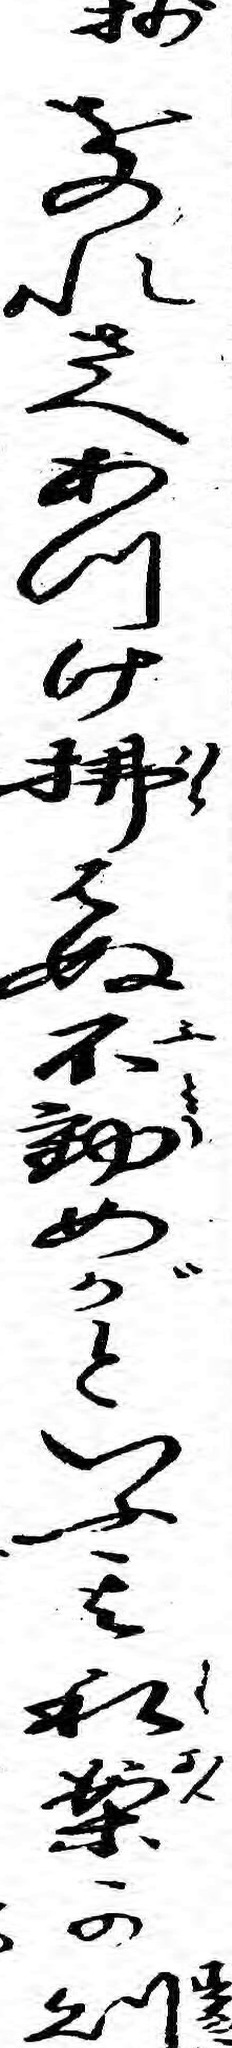をのれさへあつけ払はぬ不動めがといふ其私案か則
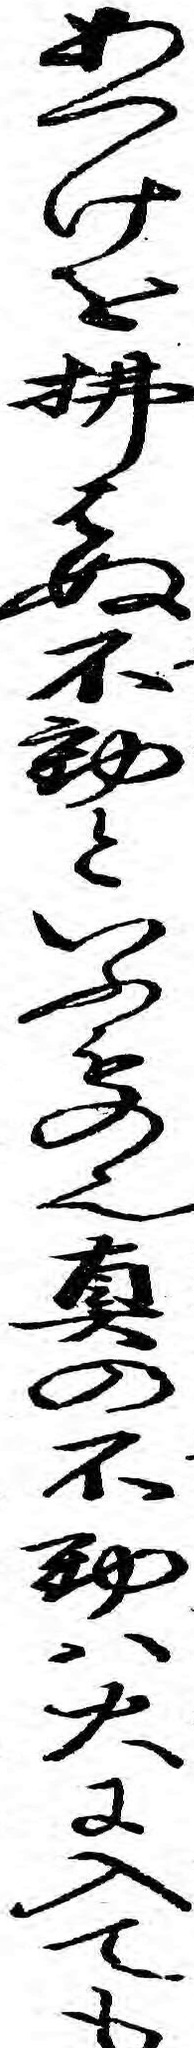あつけを払はぬ不動といふもの也真の不動は火に入ても
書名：目なし用心抄
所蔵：国文学研究資料館
